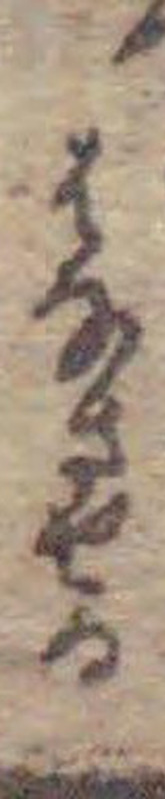はなさせる
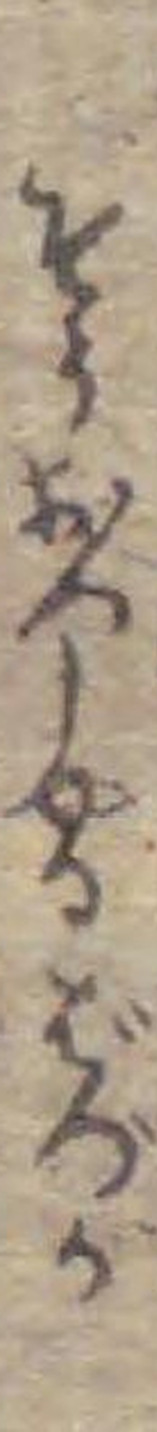そうおつしやるばづが
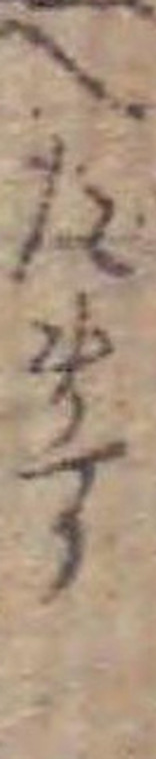だます
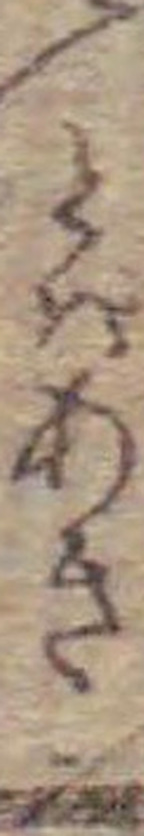とはあき
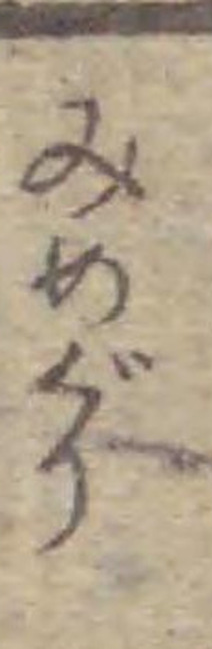みめぐり
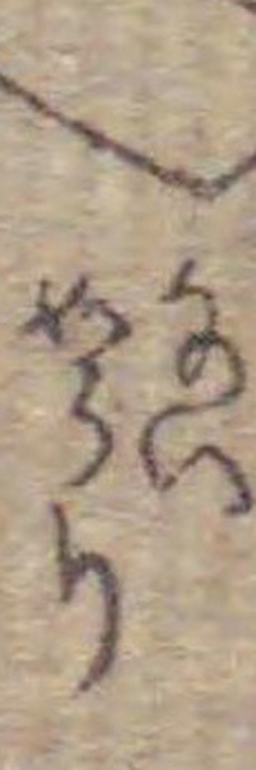めうり
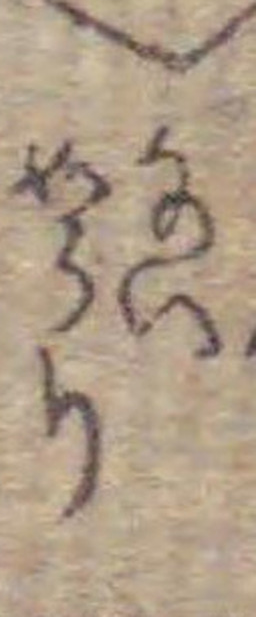めうり
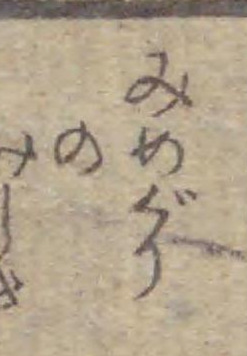みめぐり
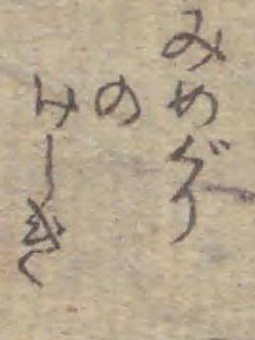けしき
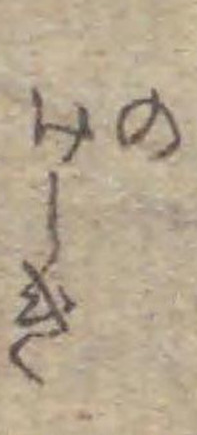けしき
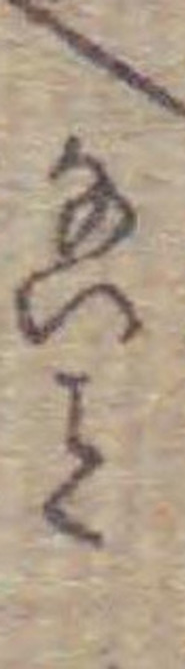ないこと
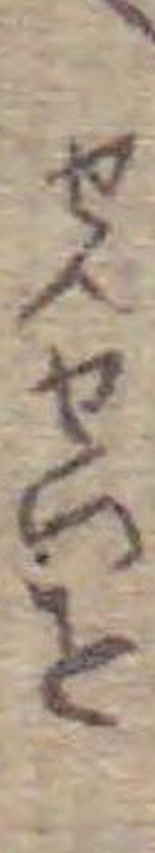せんせいを
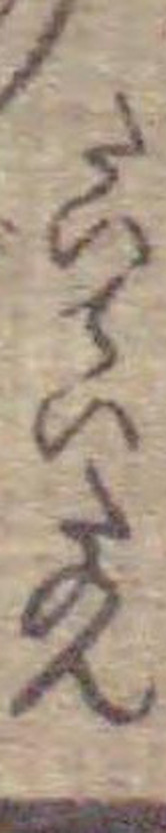たいていたのん
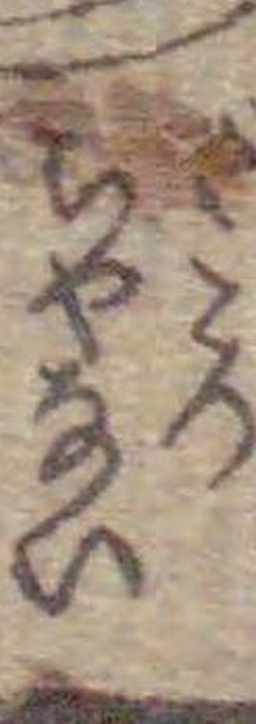ちやない
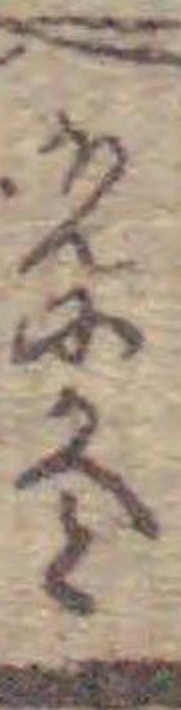ほんにかへと
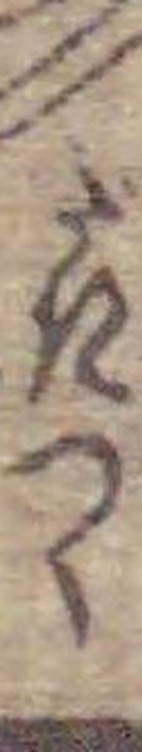だきつく
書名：芸者呼子鳥 : 2巻（松泉堂）
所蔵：国立国会図書館 National Diet Library, JAPAN
